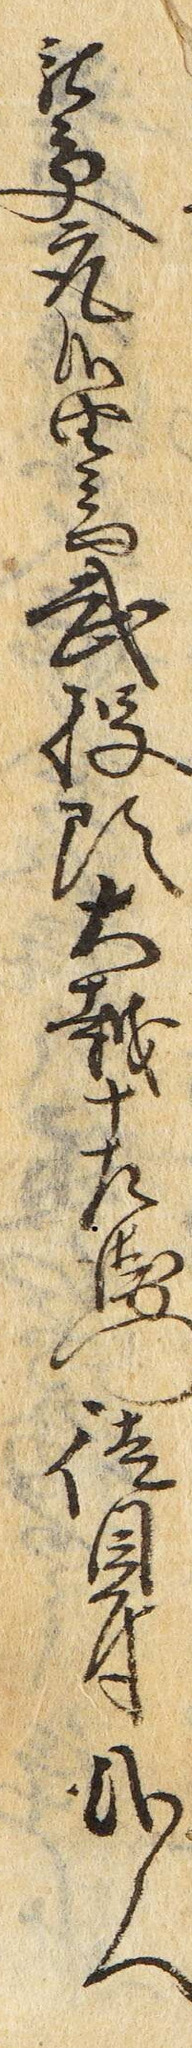被受取候ニ而武役頭大越十左衛門徒目付弐人

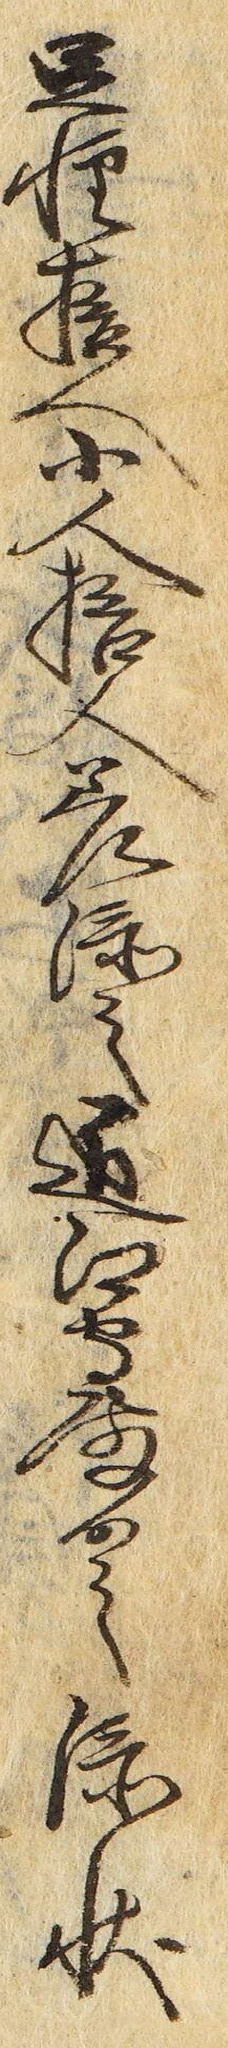足軽拾人小人拾人差添之近江守殿ゟ之添状
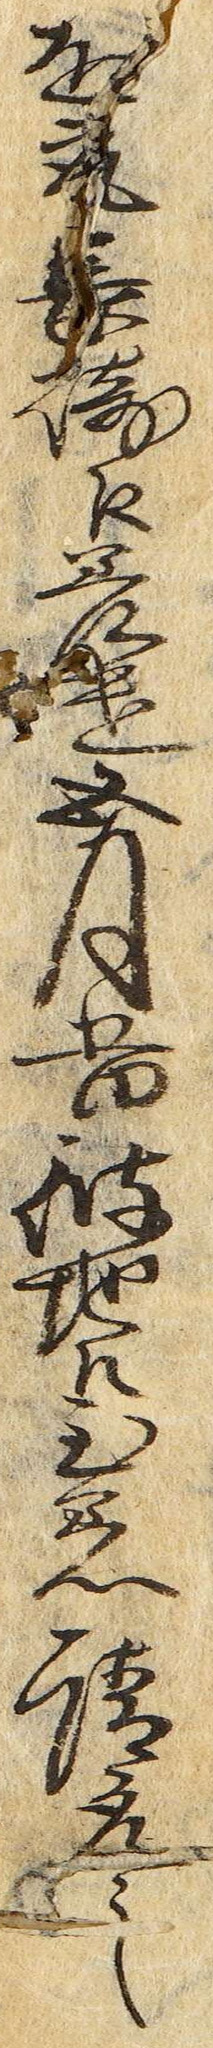取長崎江差遣五月五日彼地江到着請取之
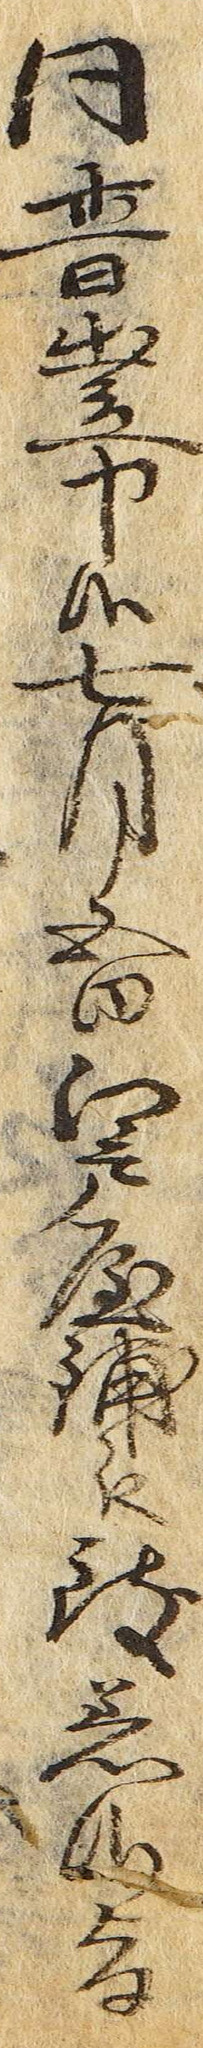同廿一日出立申候七月五日江戸屋鋪江致着候旨
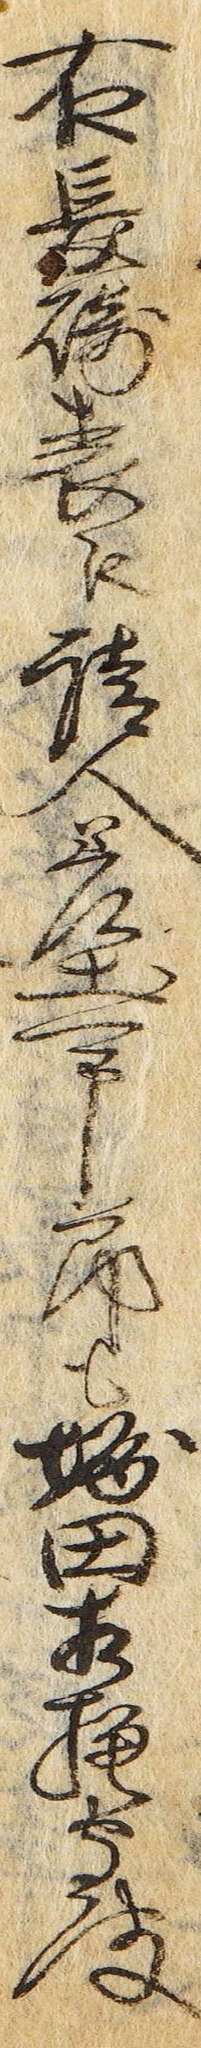右長崎表江請人差出可申節も堀田相模守殿
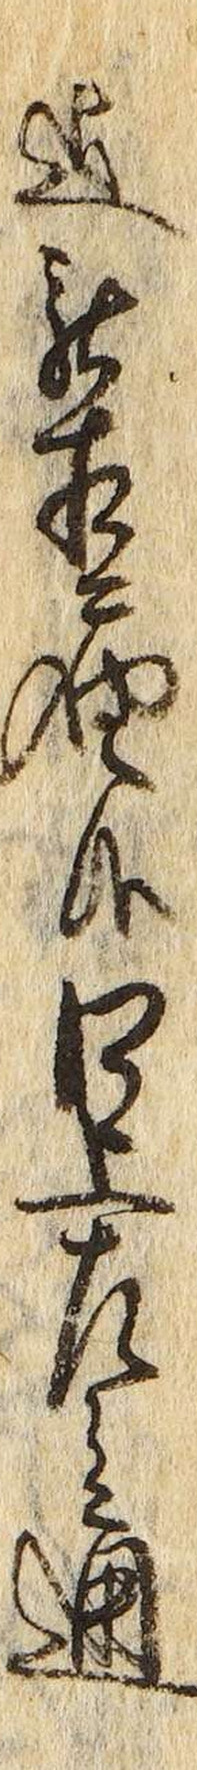迄被相届候口上左之通
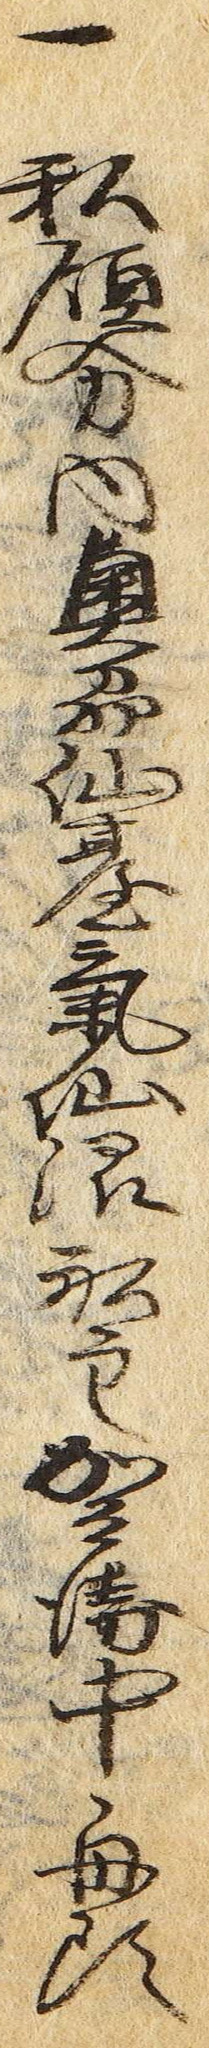一私領分内奥州仙台気仙沼船主加兵衛中舟頭
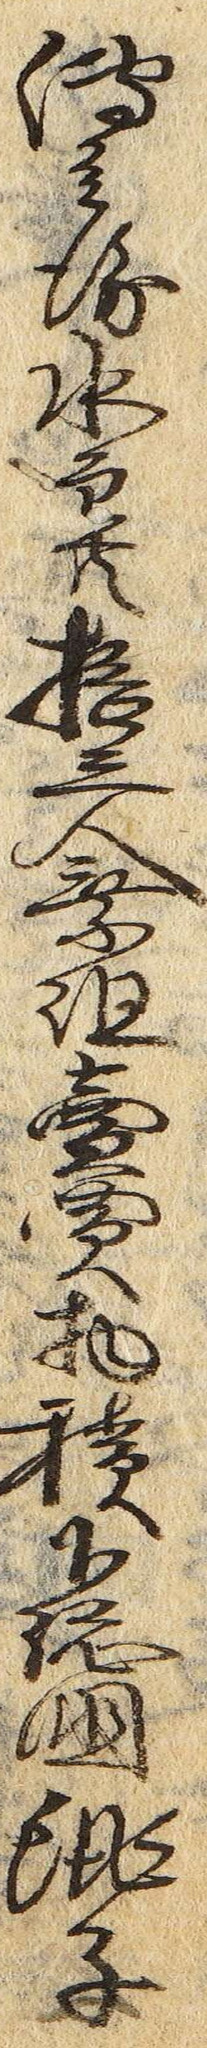伝兵衛水主共拾三人乗組売買物積下総国銚子
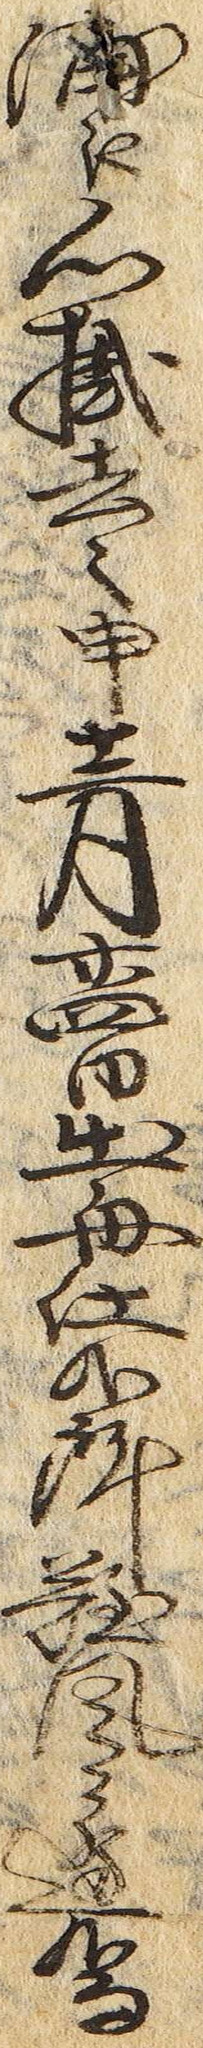浦江心掛去々申十二月廿四日出舟仕候所難風ニ逢候而
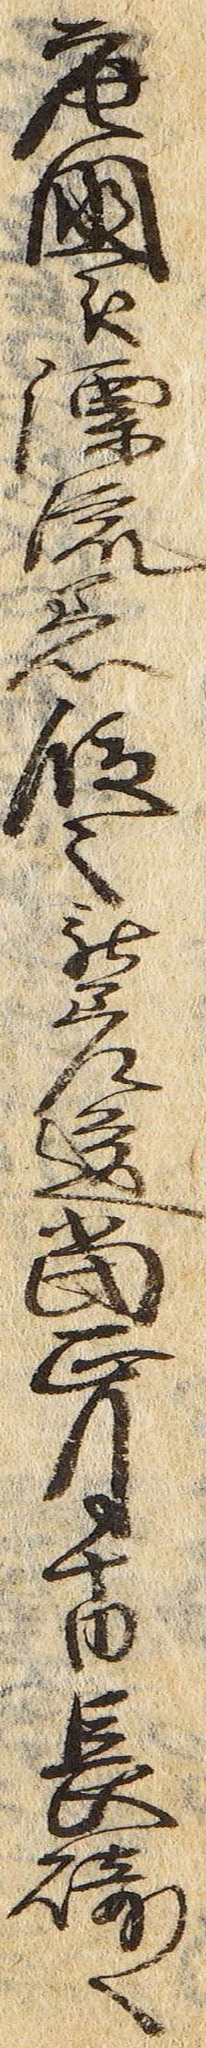唐国江漂流着段々被差送当月十日長崎へ
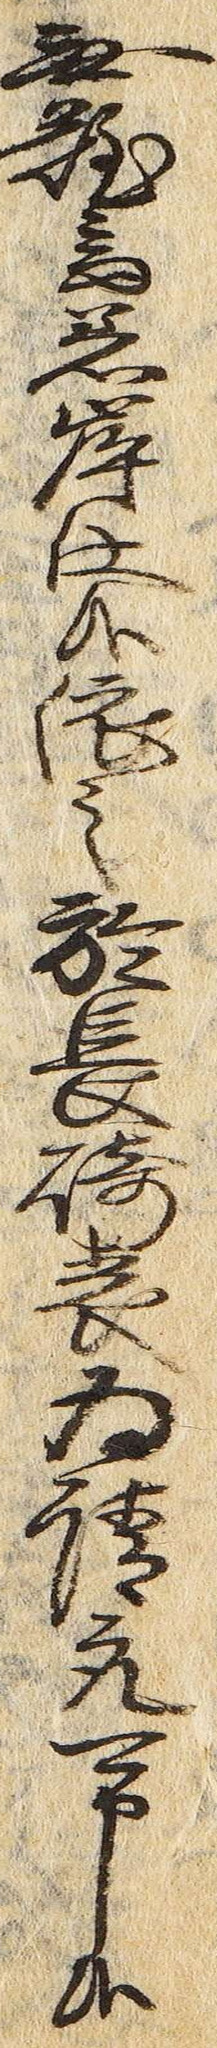無難ニ而着岸仕候依之於長崎表為請取可申候
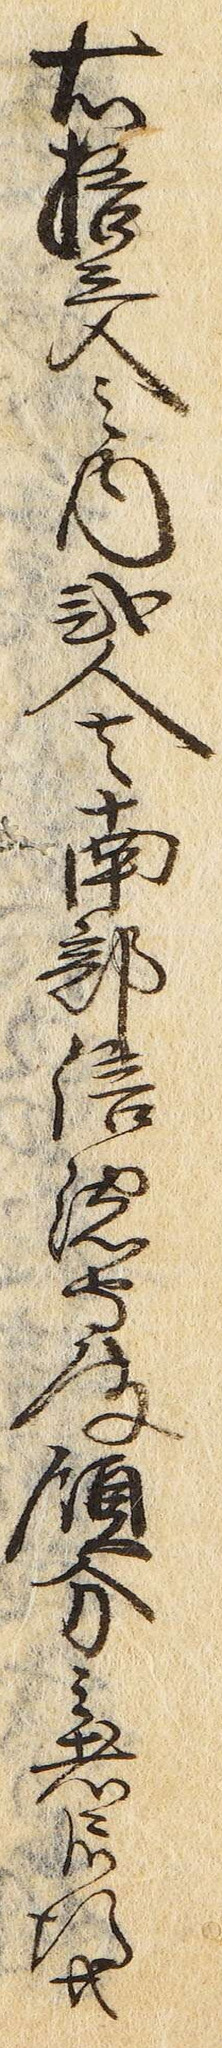右拾三人之内弐人は南部信濃守殿領分之者ニ候得共
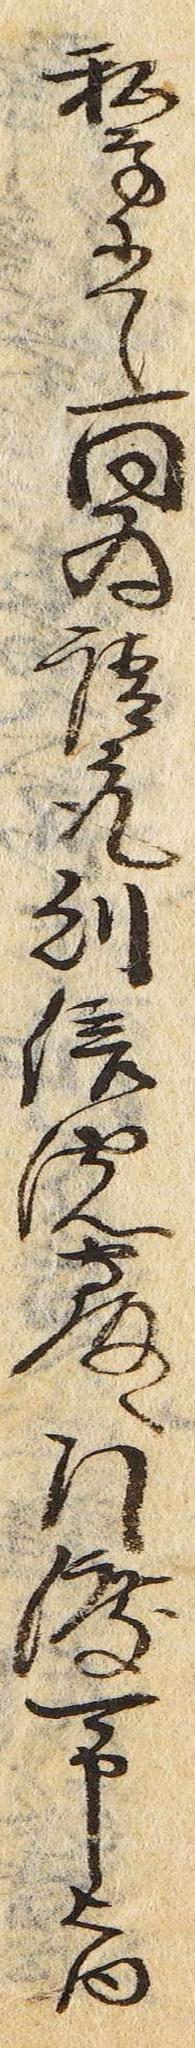私方にて一同為請取則信濃守殿へ引渡可申旨
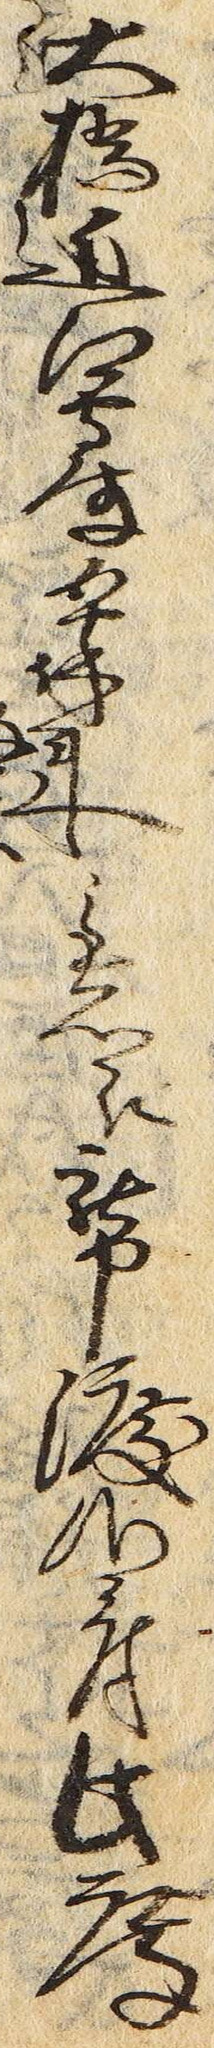大橋近江守殿御家来之者江被申渡候ニ付此度
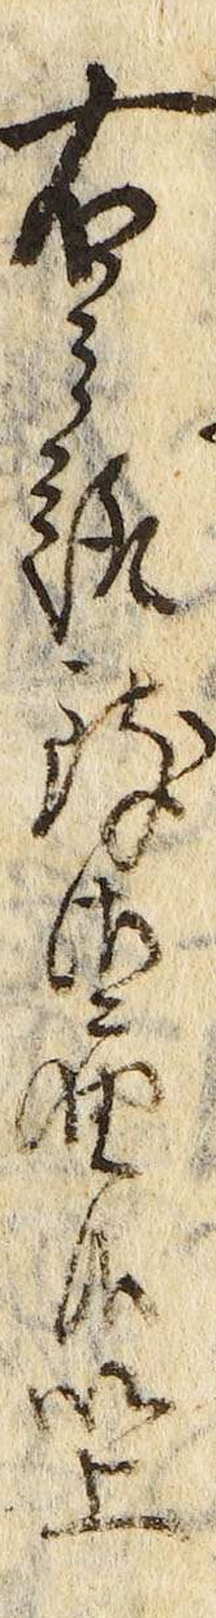右之趣致御届候以上
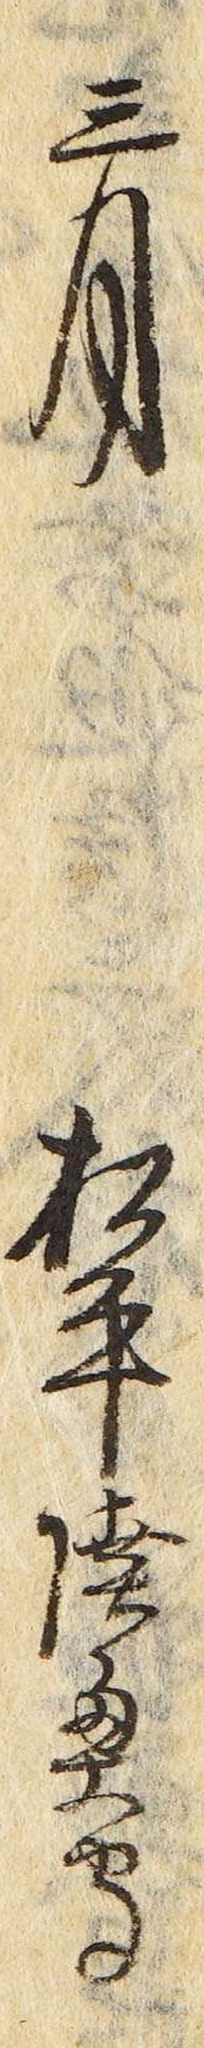三月松平陸奥守
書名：奥州仙台領之者唐国江漂流一件
